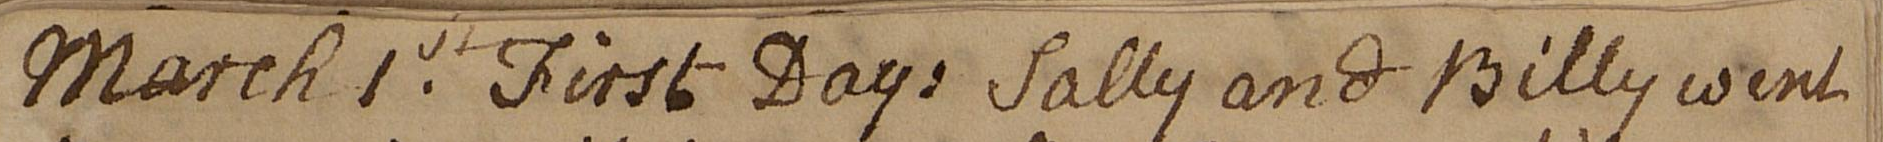March 1^st. First Day: Sally and Billy went
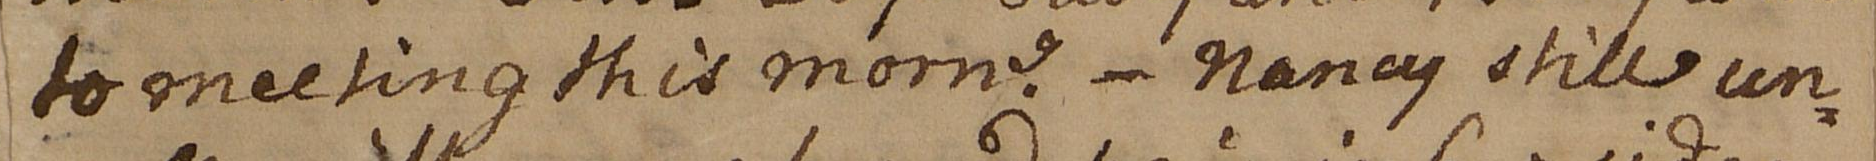to meeting this morn^g.- Nancy still un-
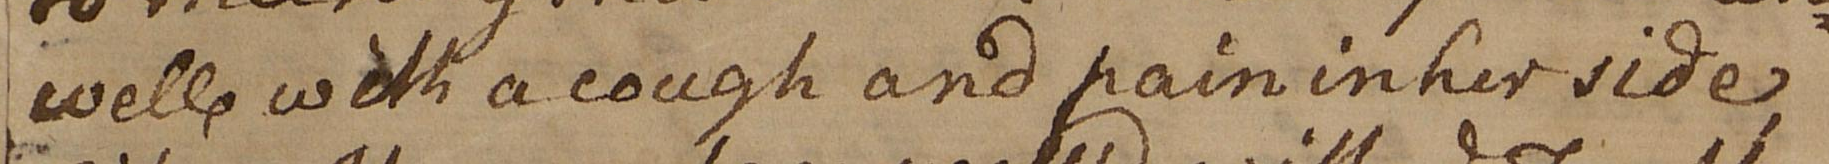well with a cough and pain in her side
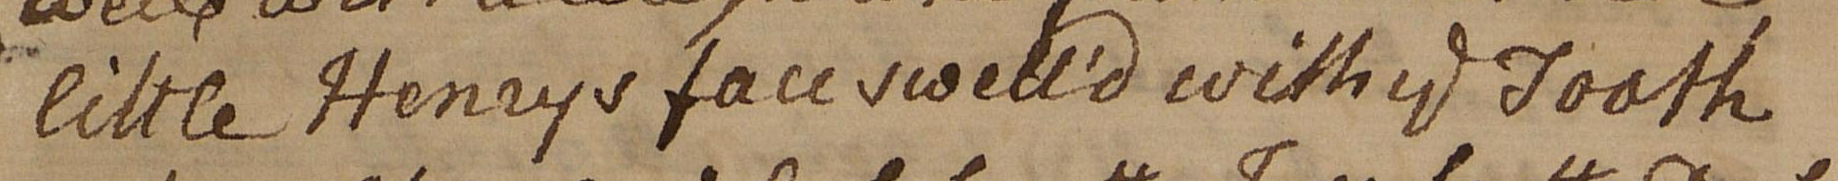little Henrys face swell'd with y^e Tooth
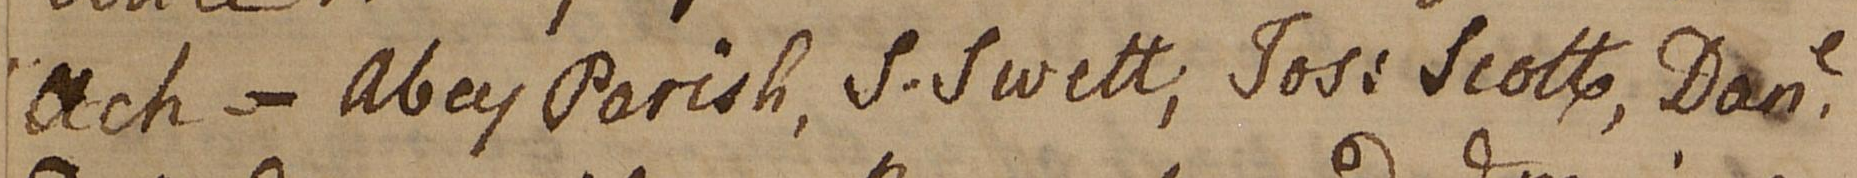Ach- Abey Parish, S. Swett, Jos: Scott, Dan^l.
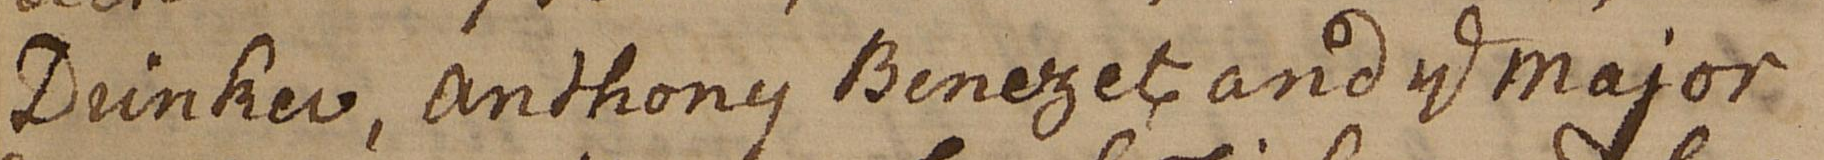Drinker, Anthony Benezet, and y^e Major
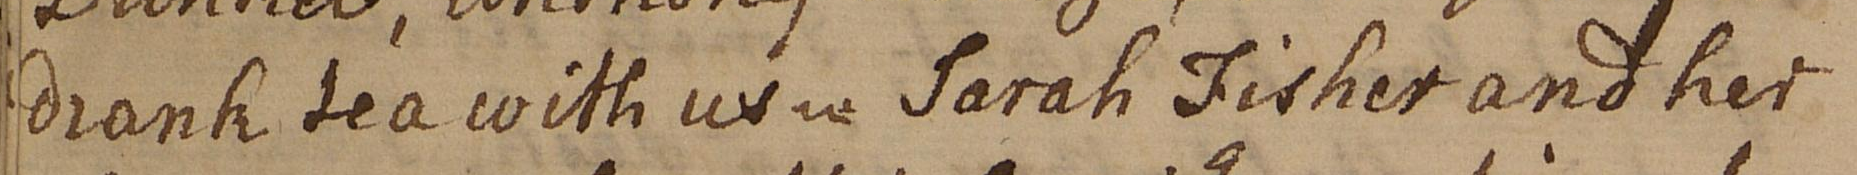drank tea with us- Sarah Fisher and her
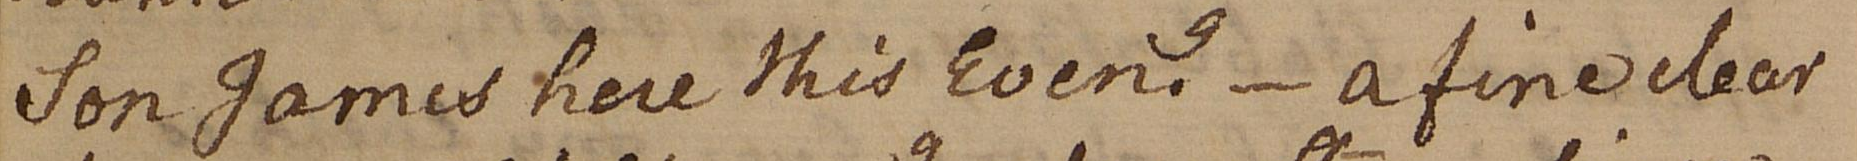Son James here this Even^g.- a fine clear
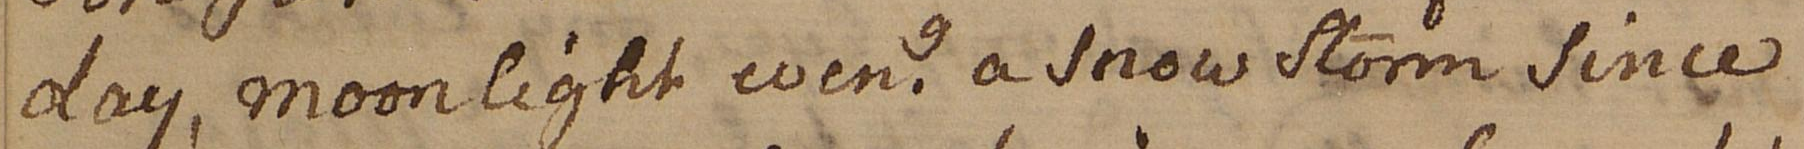day, moonlight even^g. a Snow Storm Since
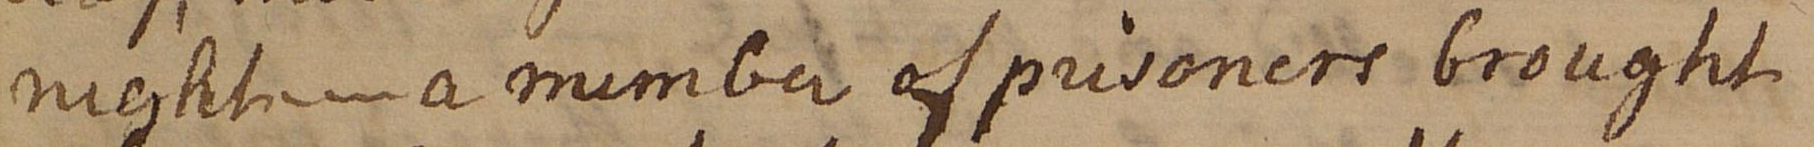night- a number of prisoners brought
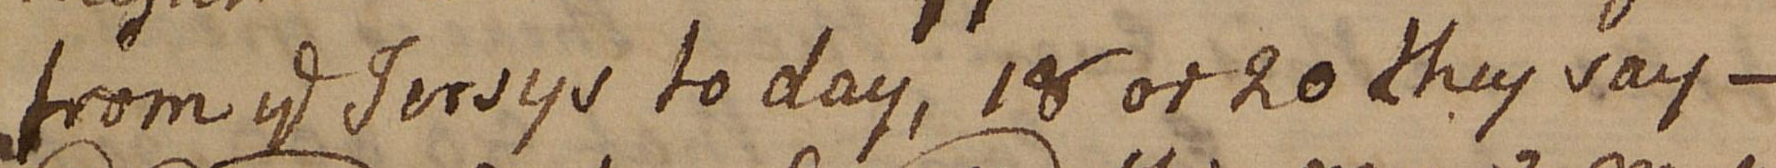from y^e Jersys to day, 18 or 20 they say-
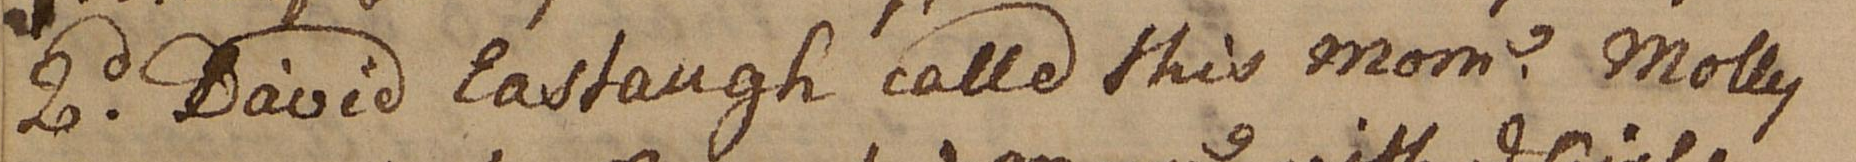2^d. David Eastaugh calld this Morn^g. Molly
